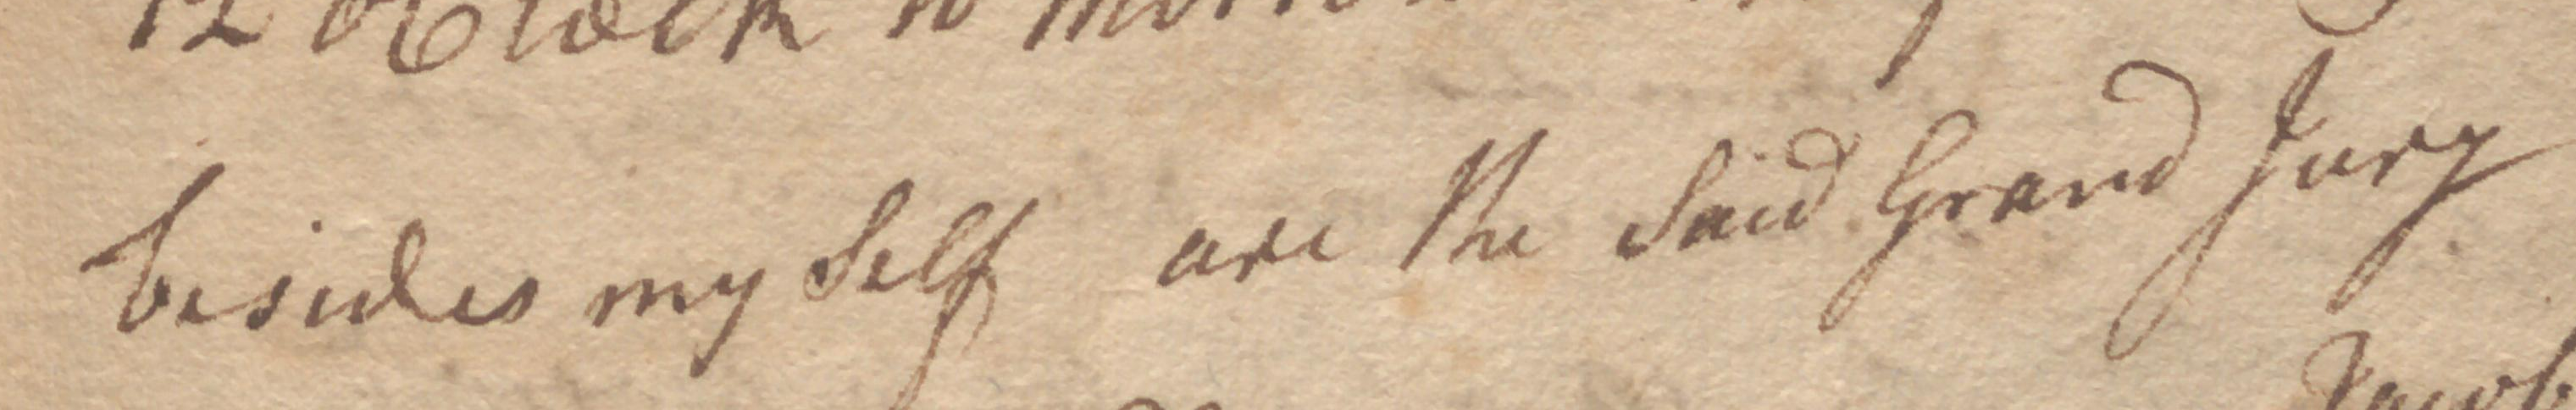besides my self are the said Grand Jury
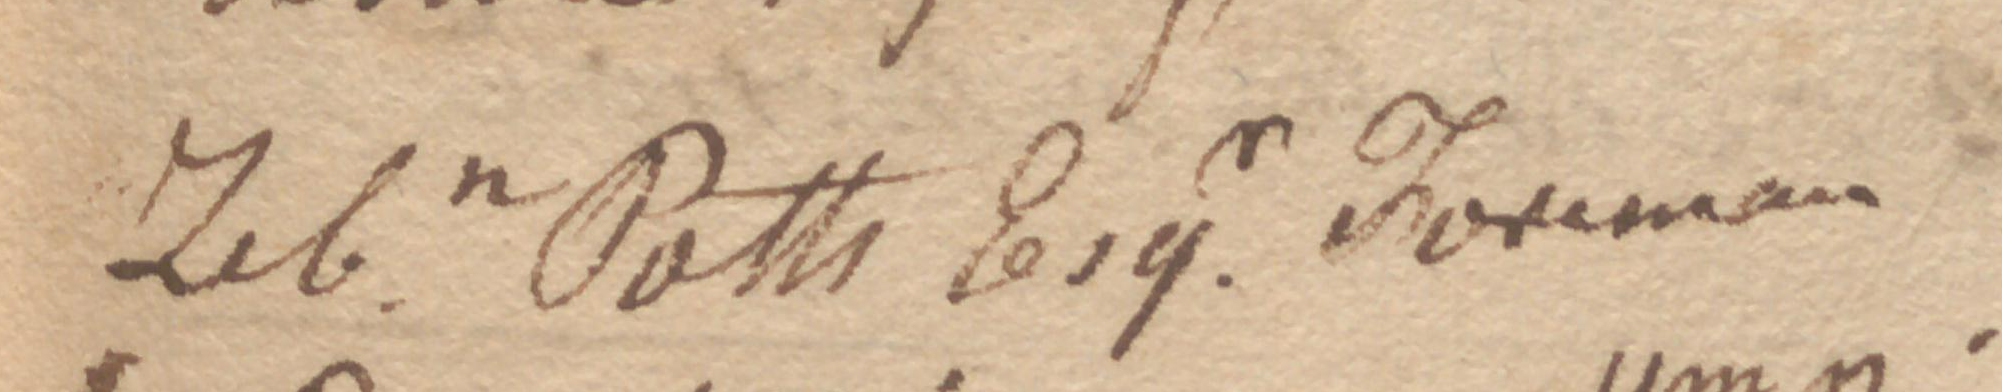Zeb^h. Potts Esq^r. Foreman
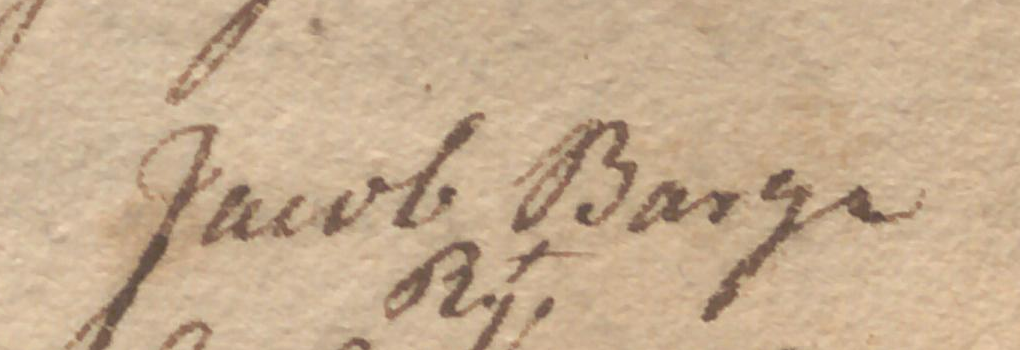Jacob Barge
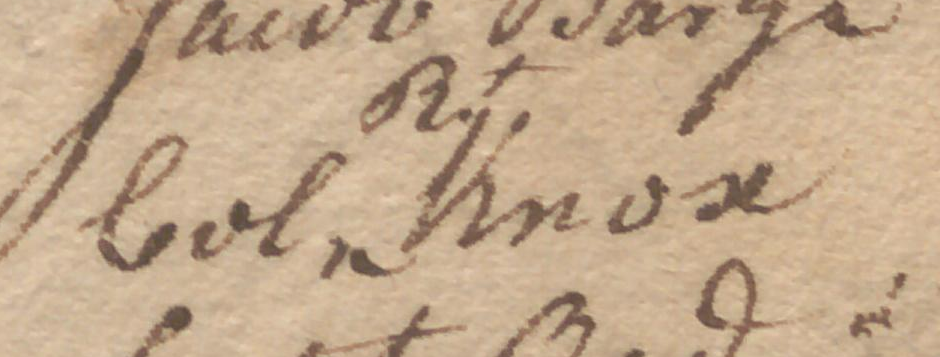Col ^ Knox
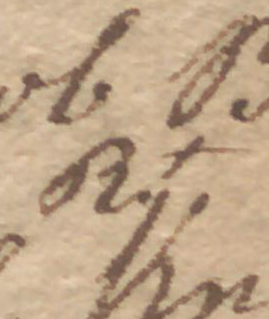R^t.
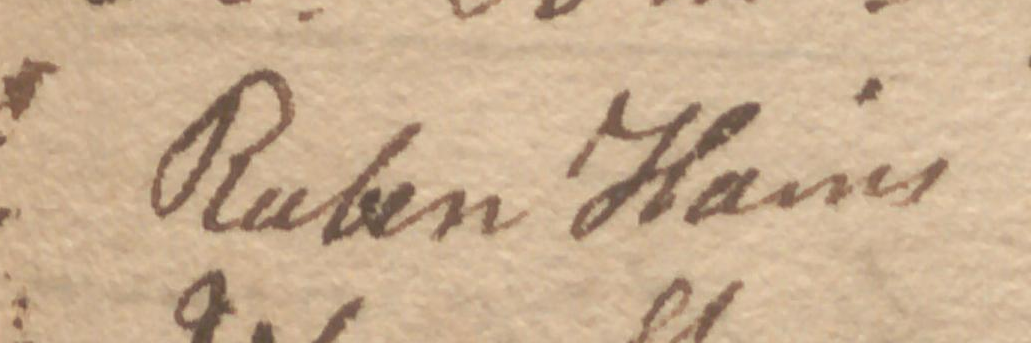Rueben Hains
